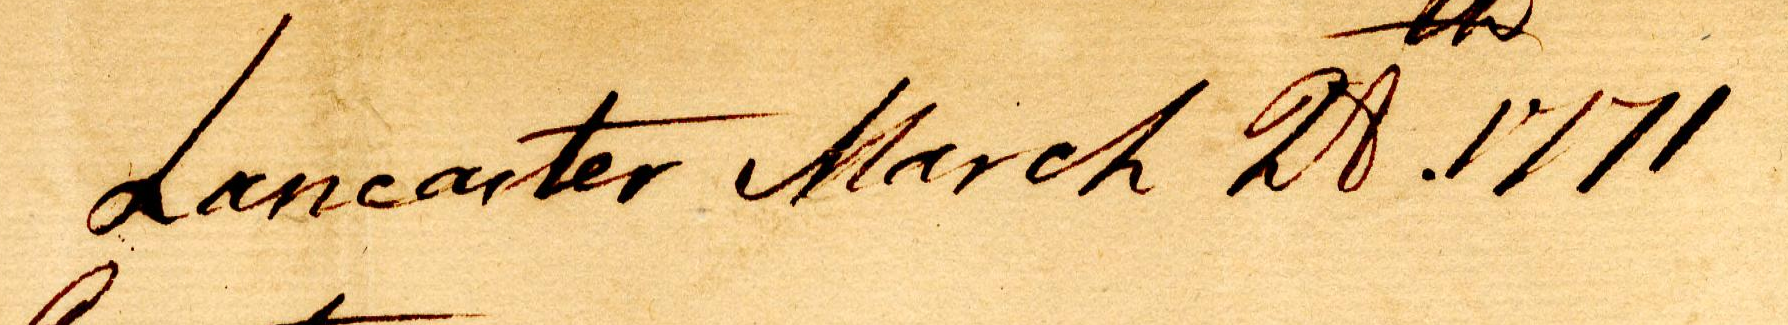Lancaster March 28^th. 1771
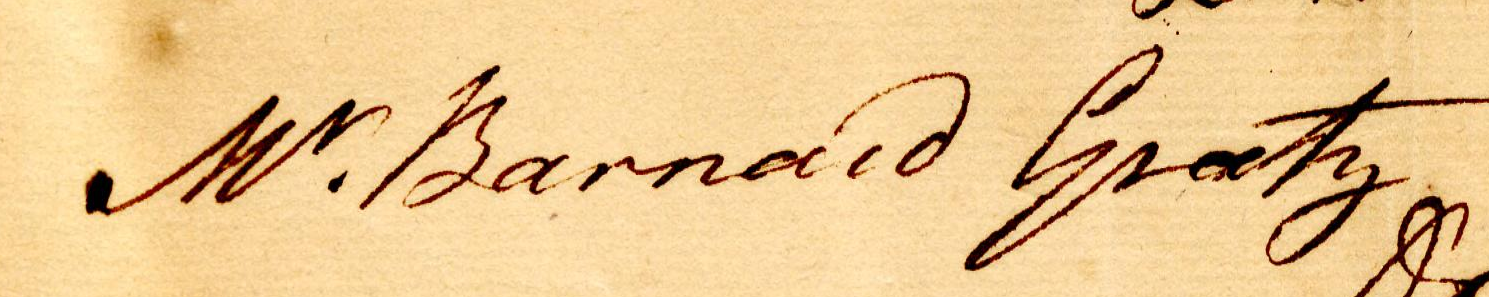M^r. Barnard Gratz,
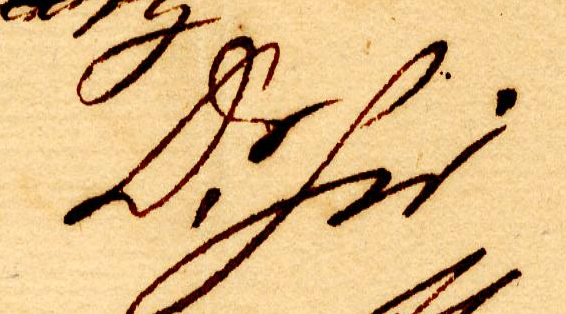D^r Sir
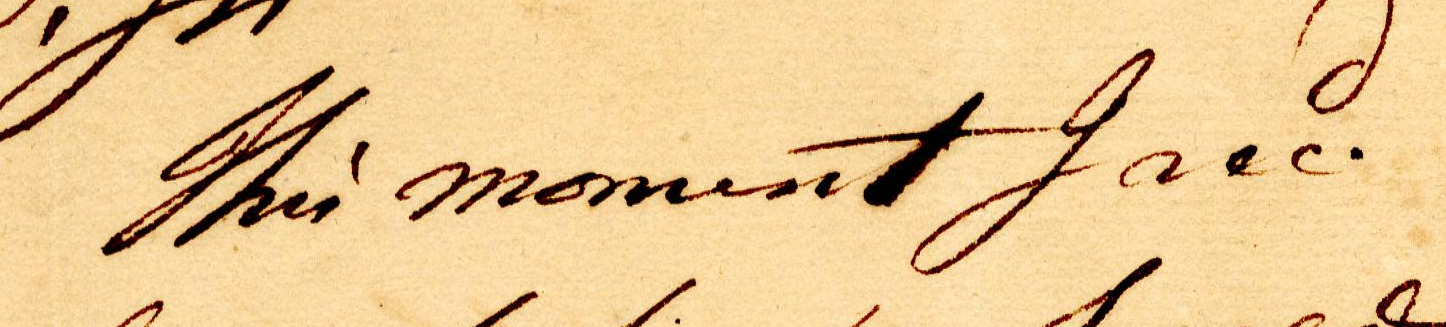This moment I rec^d
